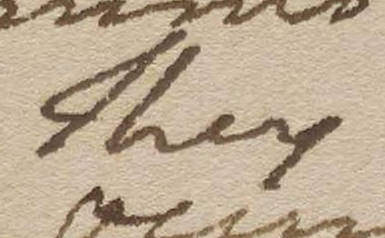They
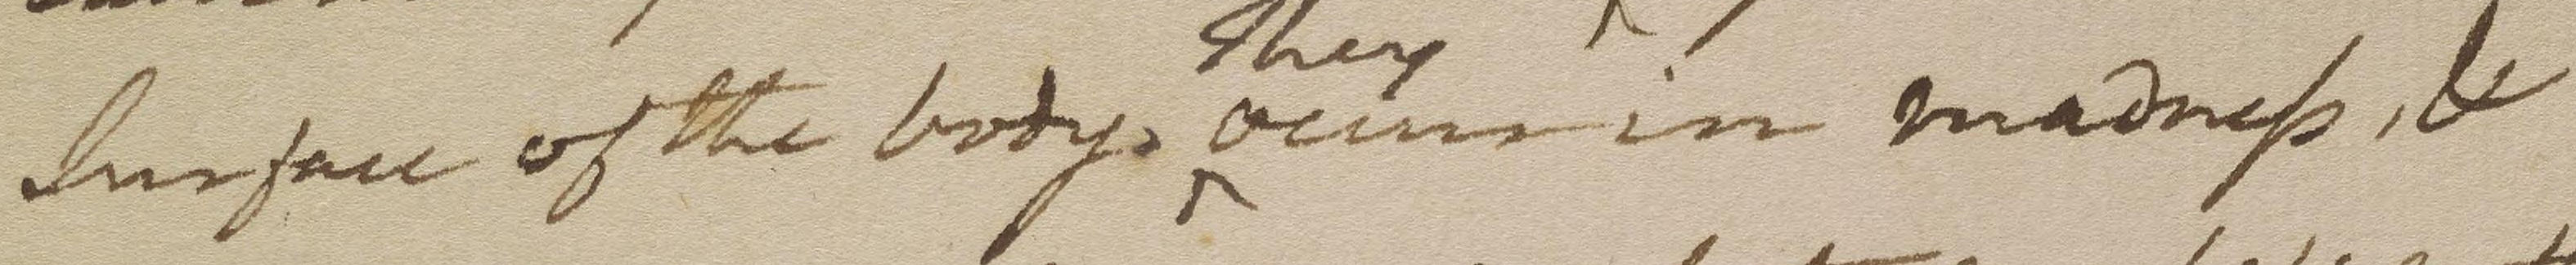surface of the body. ^ occur in madness, &
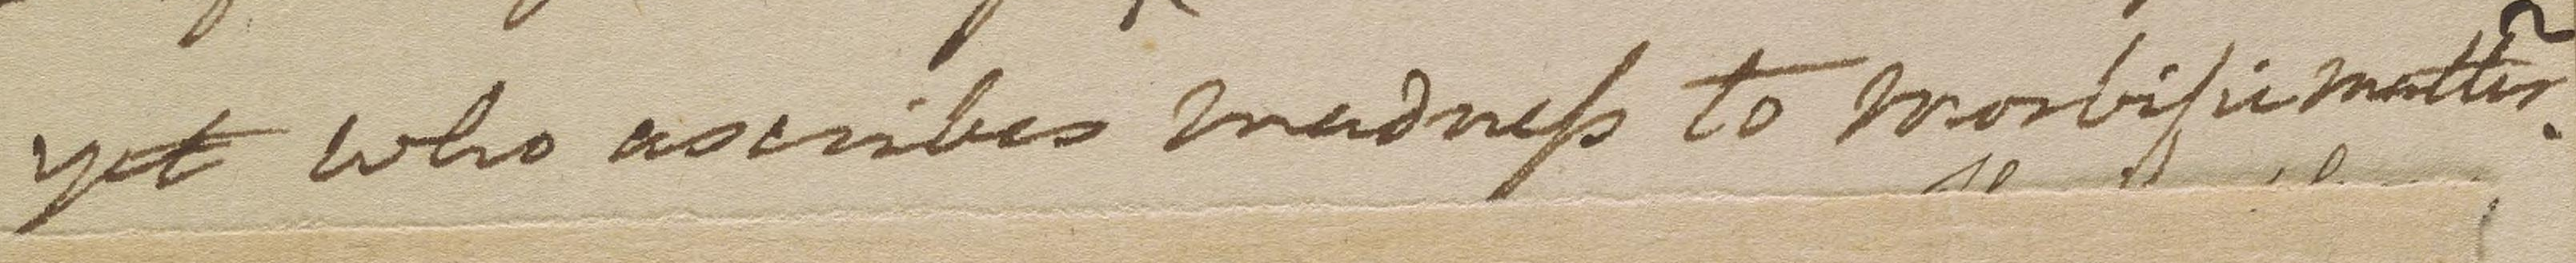yet who ascribes madness to morbific matter?
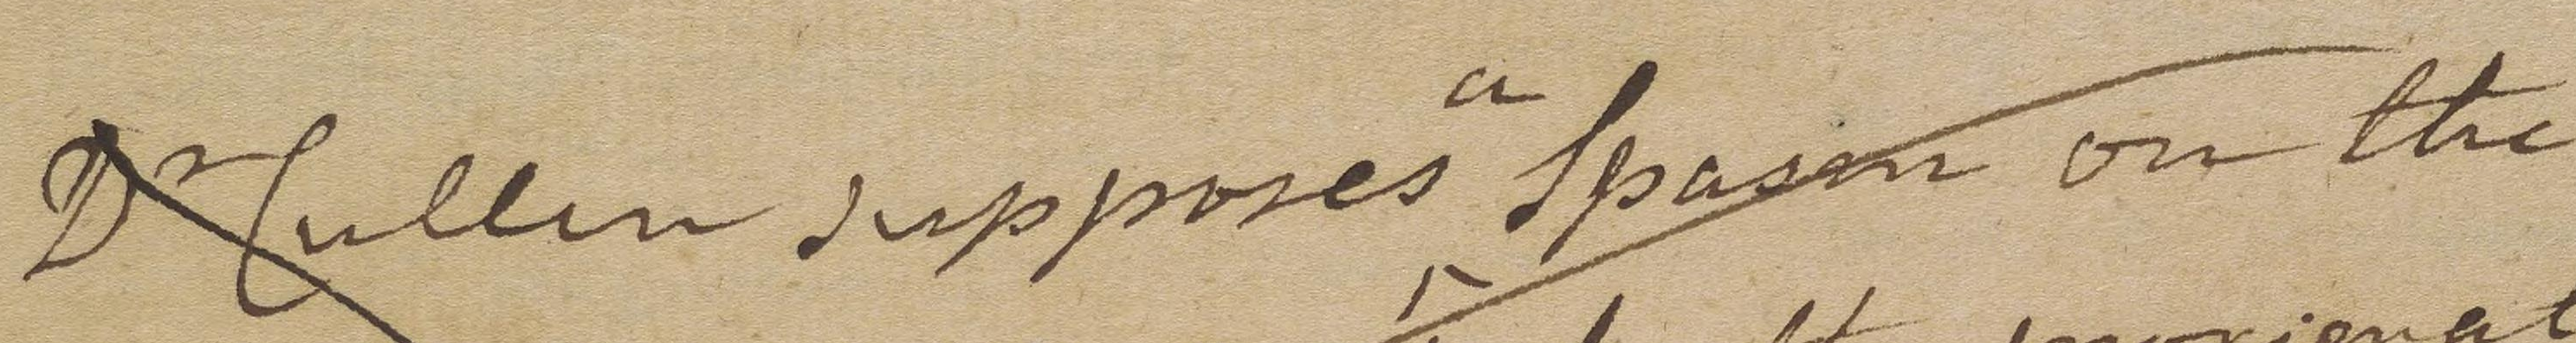D^r Cullen supposes ^a Spasm on the
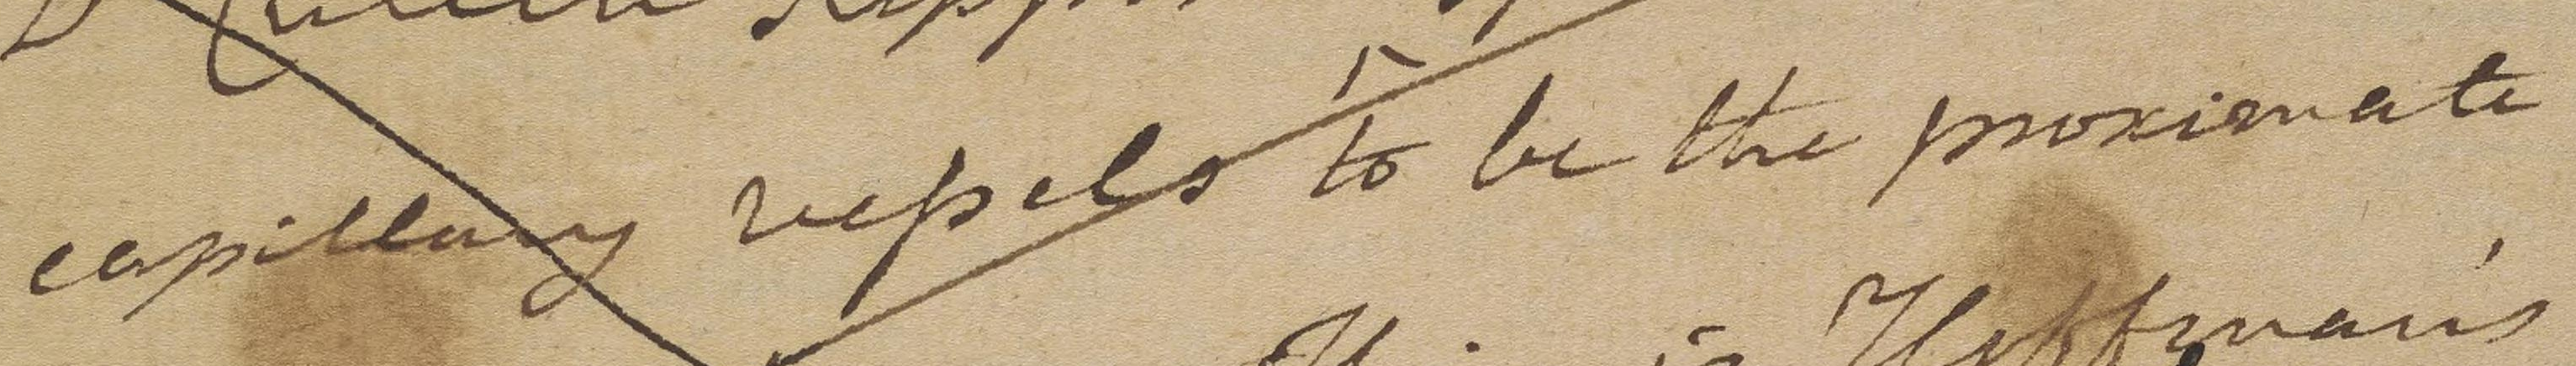capillary vessels to be the proximate
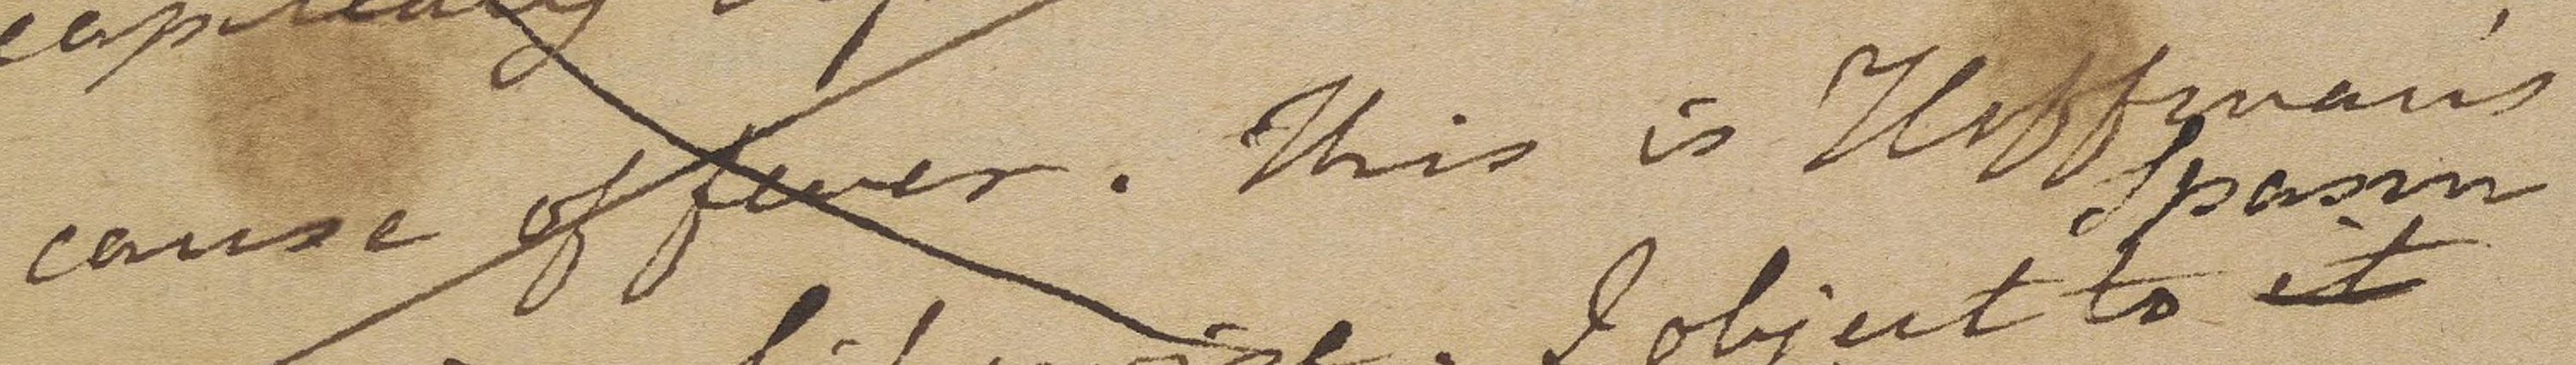cause of fever. This is Hoffman's
